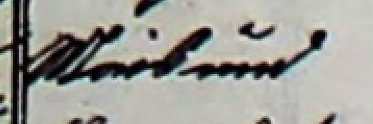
Mais und
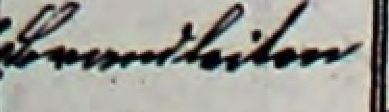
Brandleiten
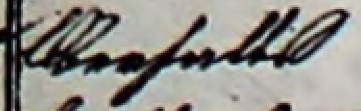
Oberfalts
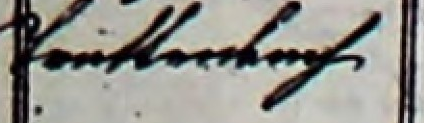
Strattenbach
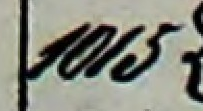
1015
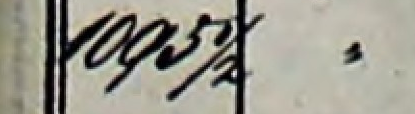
1095 1/2 „
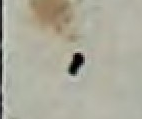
„
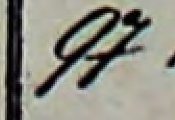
97
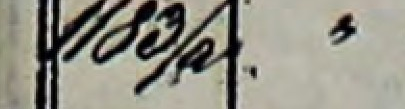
1183/a „
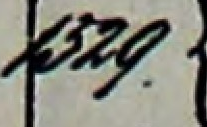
1329
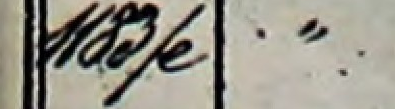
1183/c „
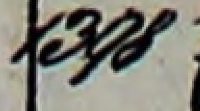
1398
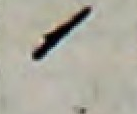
1
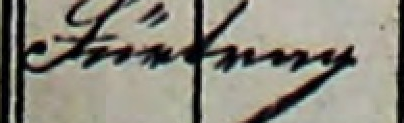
Fürtrag
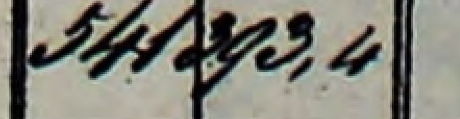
541 393,4
